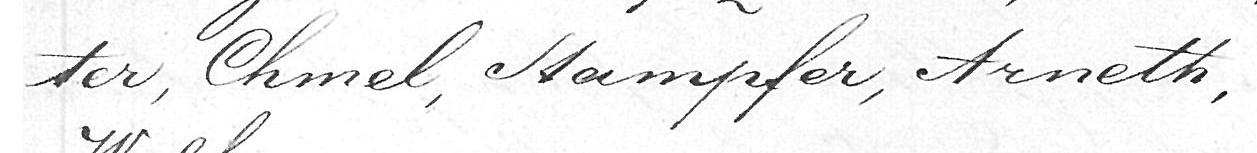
ter, Chmel, Stampfer, Arneth,
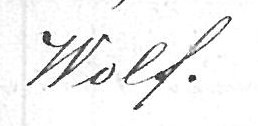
Wolf.
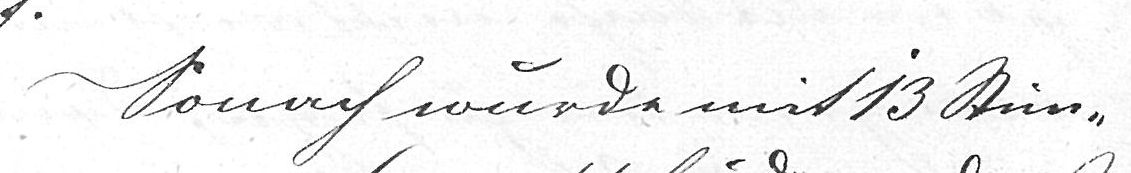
Sonach wurde mit 13 Stim-
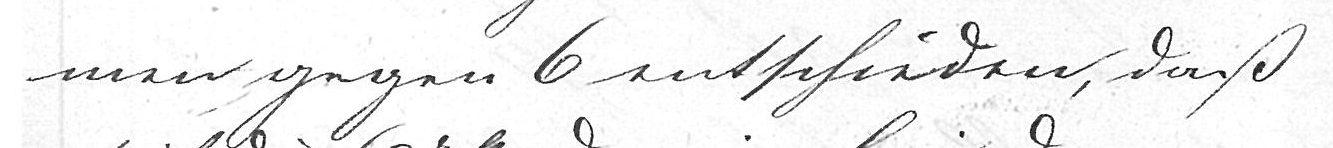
men gegen 6 entschieden, daß
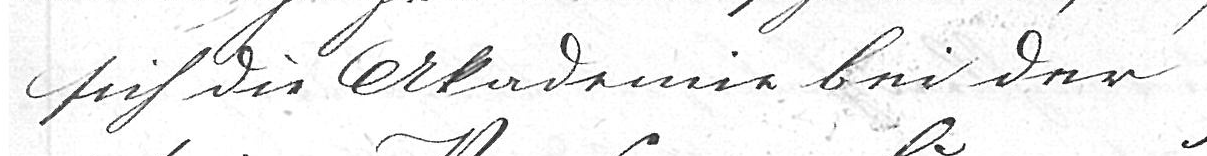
sich die Akademie bei der
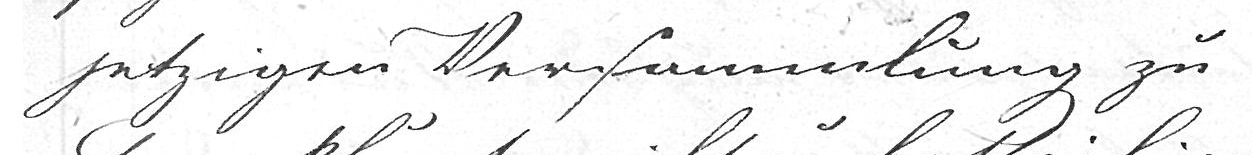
jetzigen Versammlung zu
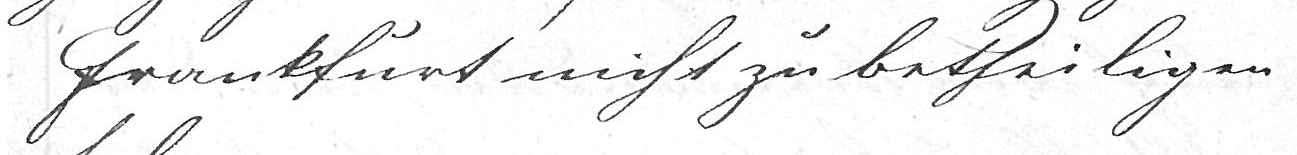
Frankfurt nicht zu betheiligen
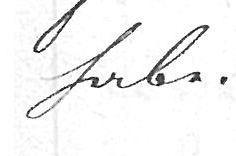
habe.
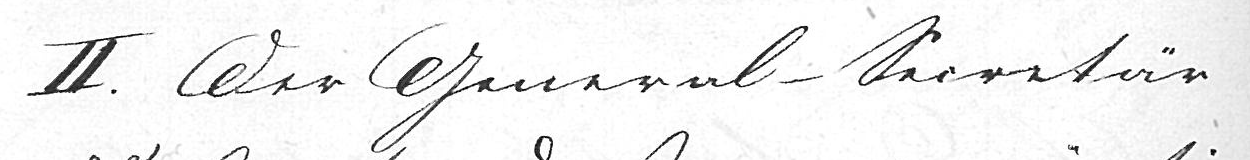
II. Der General-Secretär
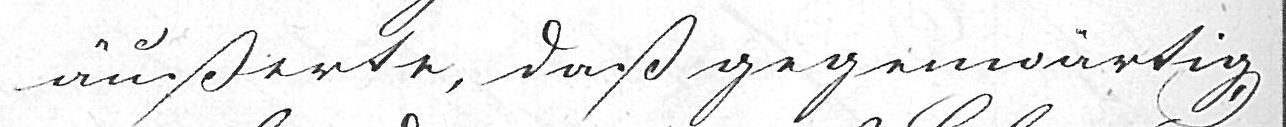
äußerte, daß gegenwärtig,
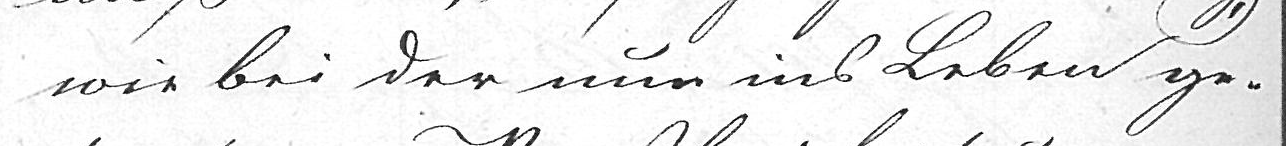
wie bei der nun ins Leben ge-
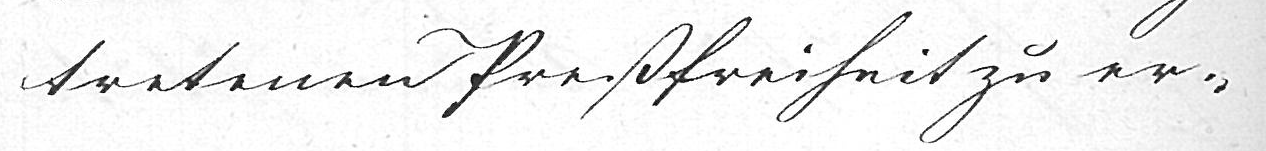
tretenen Preßfreiheit zu er-
